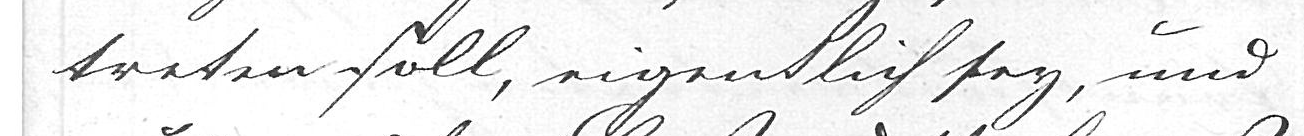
treten soll, eigentlich sey, und
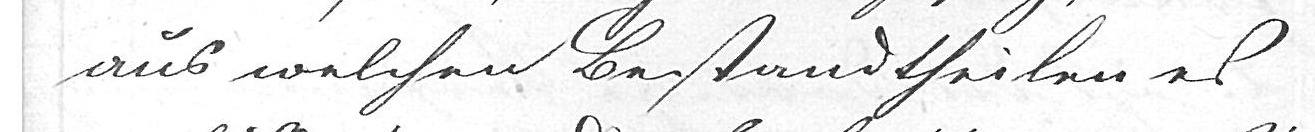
aus welchen Bestandtheilen es
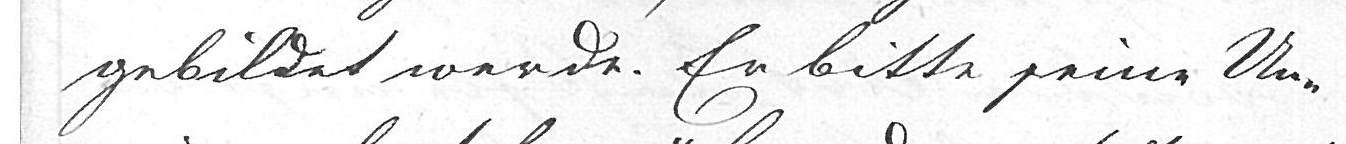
gebildet werde. Er bitte seine Un-
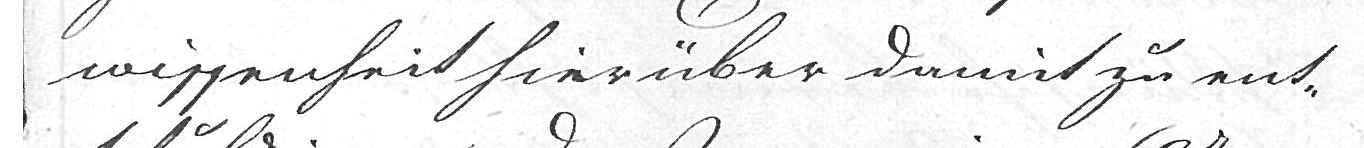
wissenheit hierüber damit zu ent-
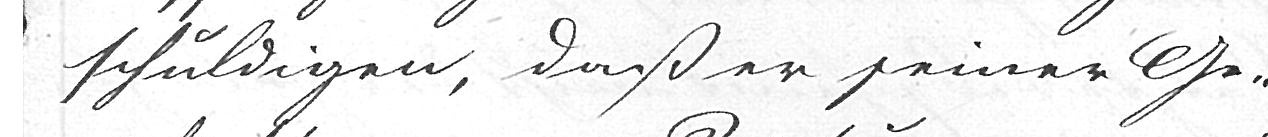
schuldigen, daß er seiner Ge-
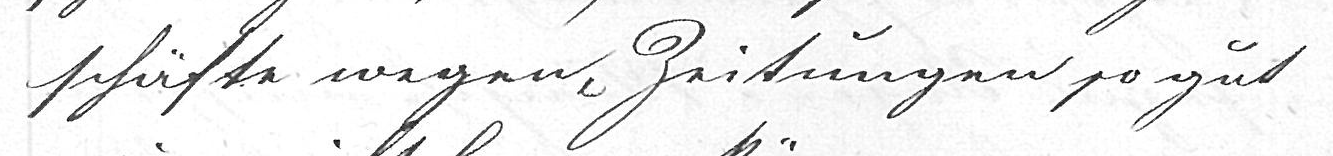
schäfte wegen Zeitungen so gut
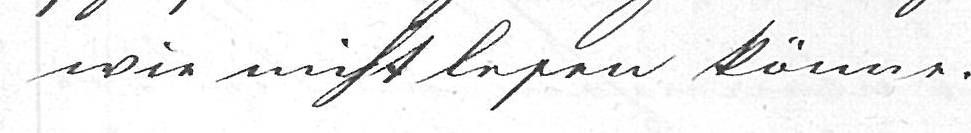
wie nicht lesen könne.
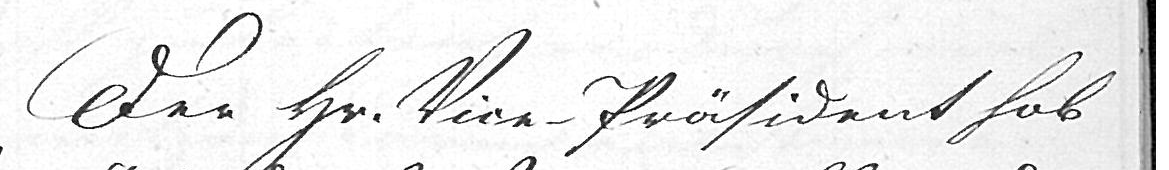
Der Hr. Vice-Präsident hob
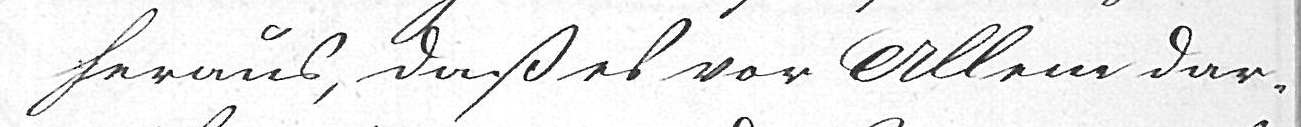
heraus, daß es vor Allem dar-
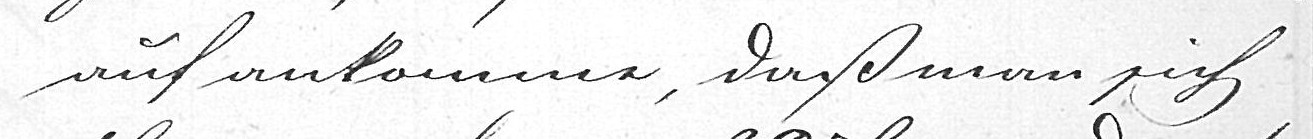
auf ankomne, daß man sich
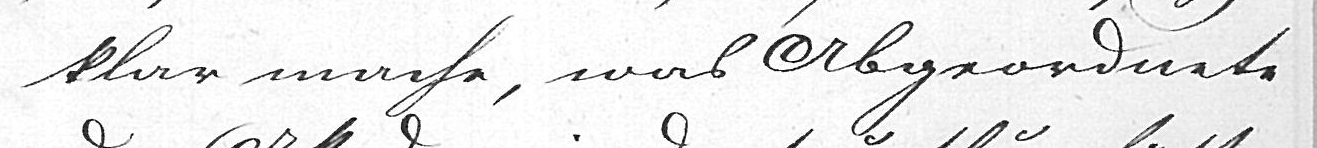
klar mache, was Abgeordnete
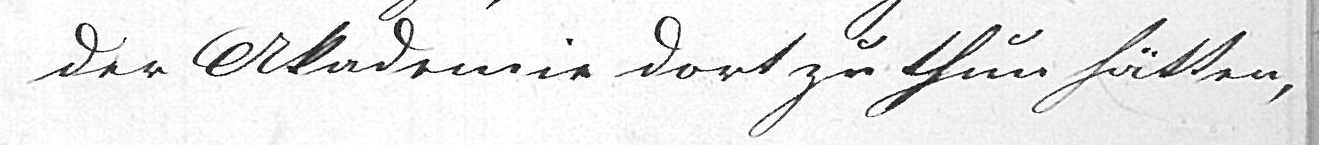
der Akademie dort zu thun hätten,
